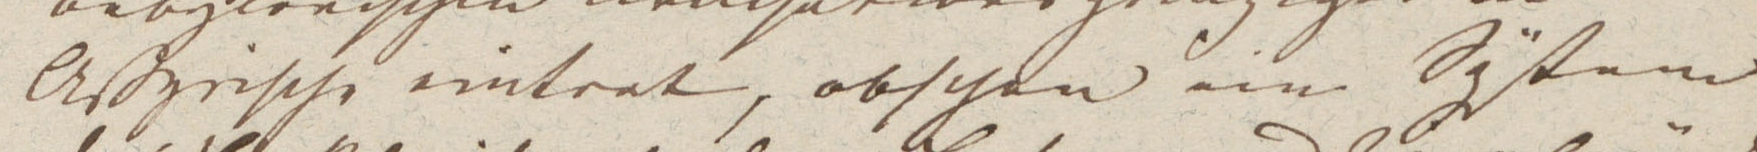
Assyrische eintrat, obschon ein System
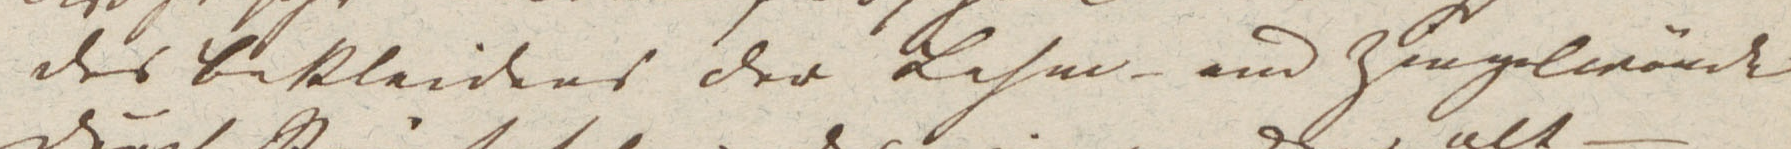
des Bekleidens der Lehm- und Ziegelwände
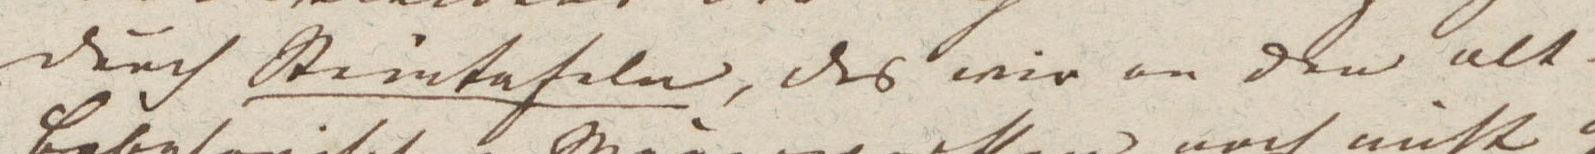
durch Steintafeln, das wir an den alt-
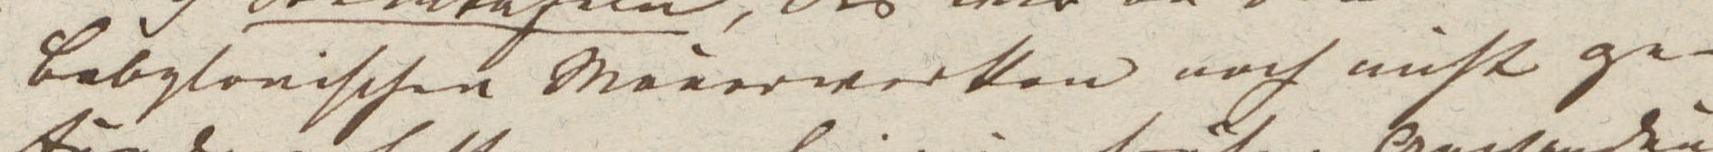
Babylonischen Mauerwerken noch nicht ge-
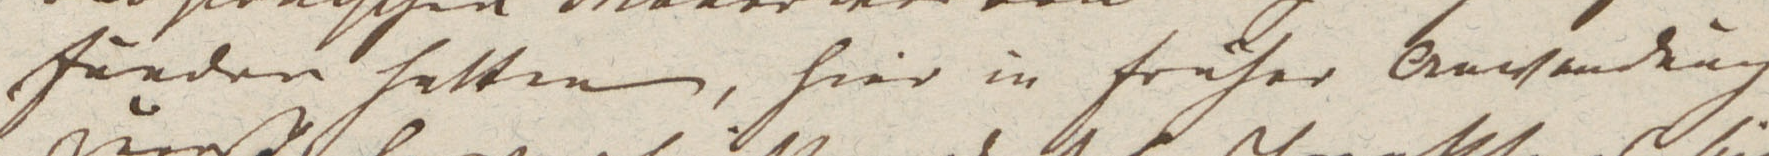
funden hatten, hier in früher Anwendung
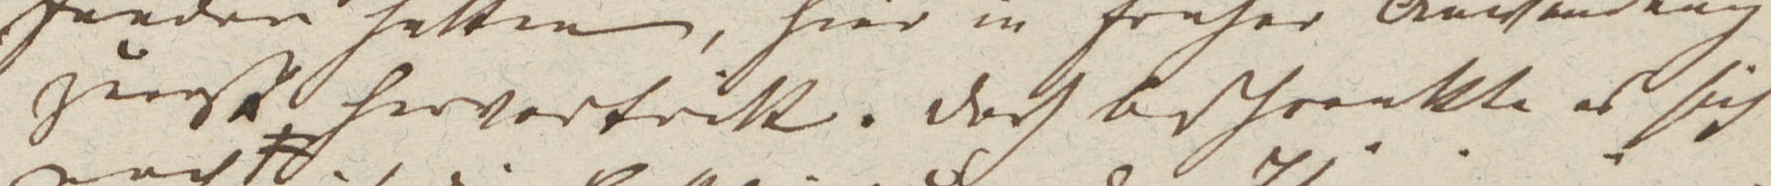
zuerst hervortritt. Doch beschrankte es sich
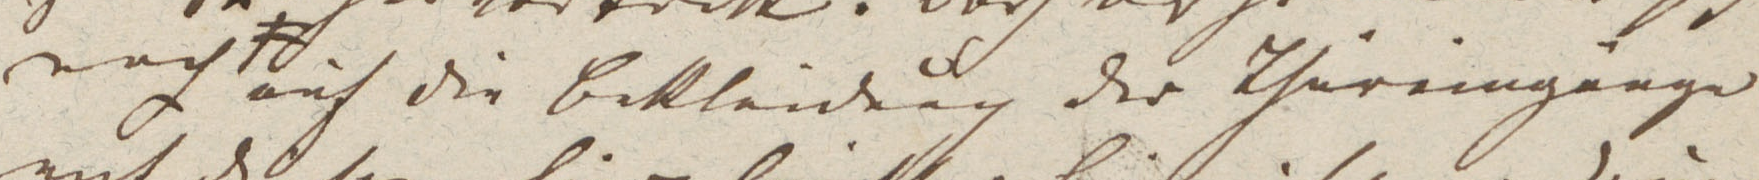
noch % auf die Bekleidung der Thüreingänge
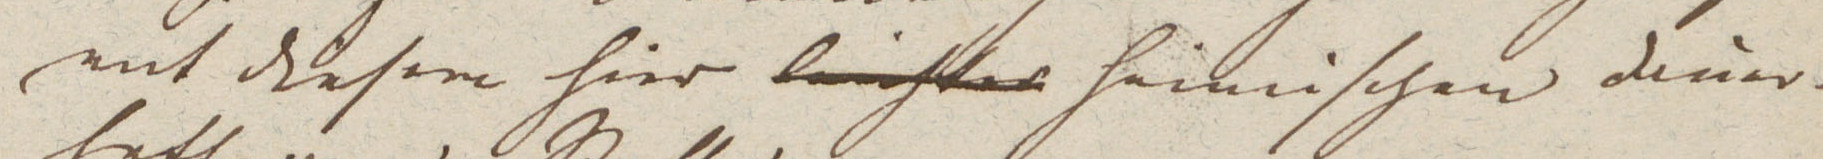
mit diesem hier leichter heimischen dauer-
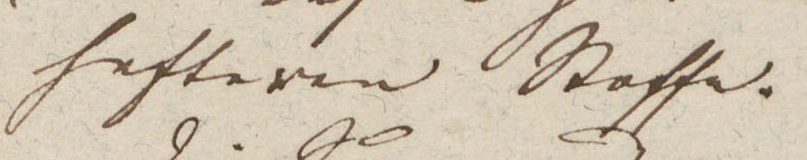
hafteren Stoffe.
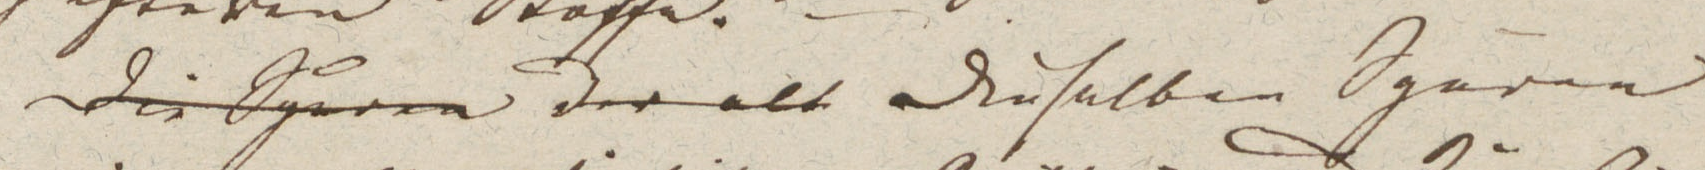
Die Spuren der alt Dieselben Spuren
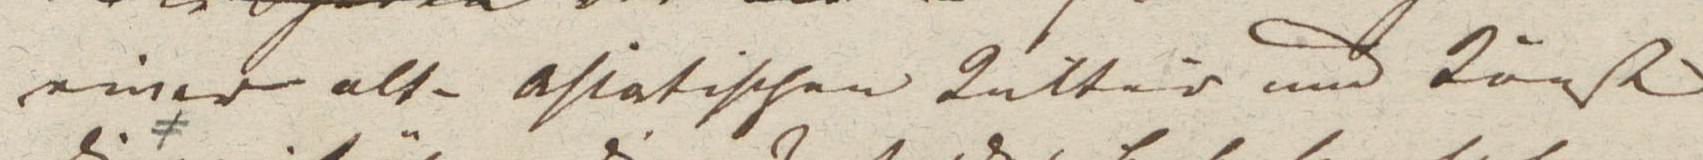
einer alt-asiatischen Kultur und Kunst
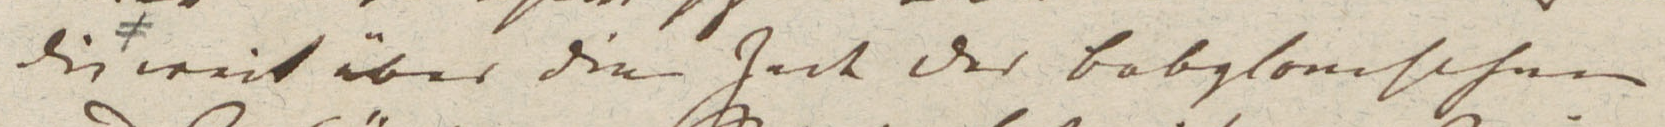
die % weit über die Zeit der babylonischen
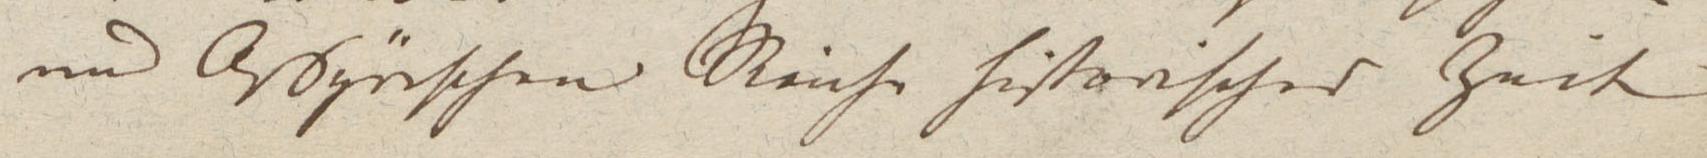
und Assyrischen Reiche historischer Zeit
